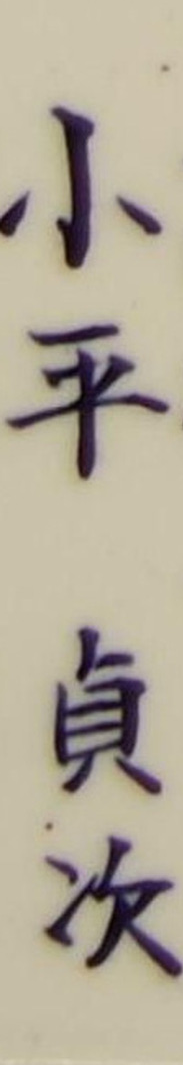小平貞次
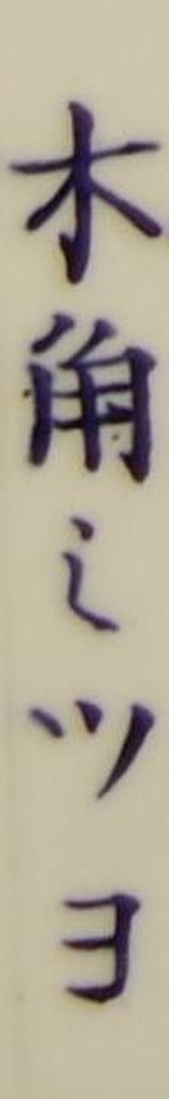木角ミツヨ

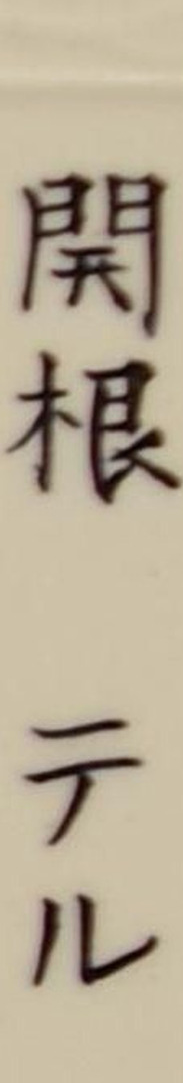開根テル
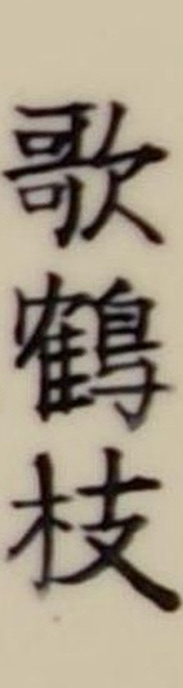歌鶴枝
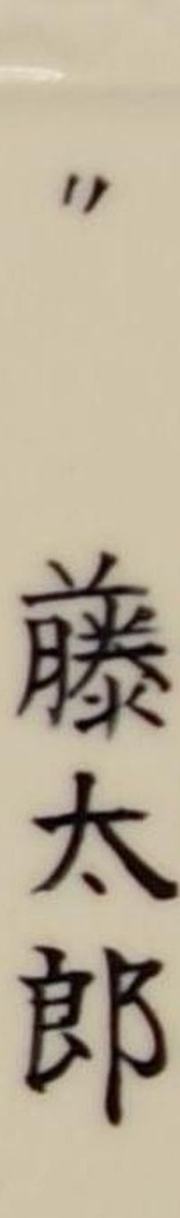藤太郎
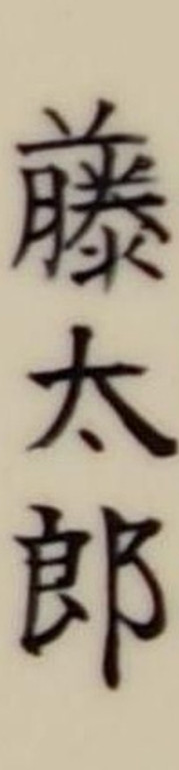藤太郎
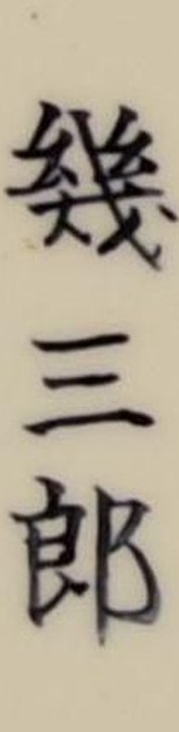幾三郎
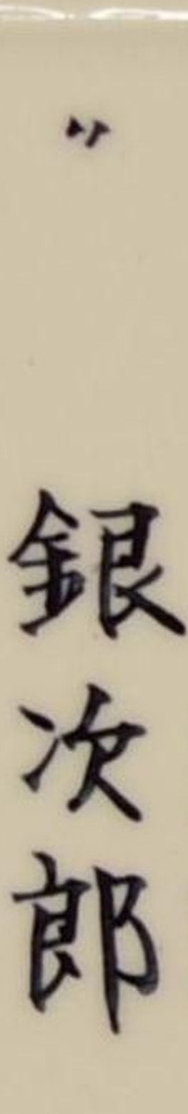銀次郎
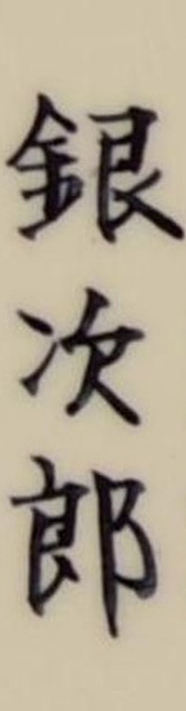銀次郎
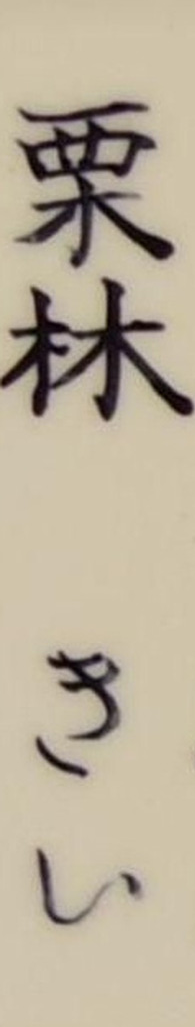栗林きい
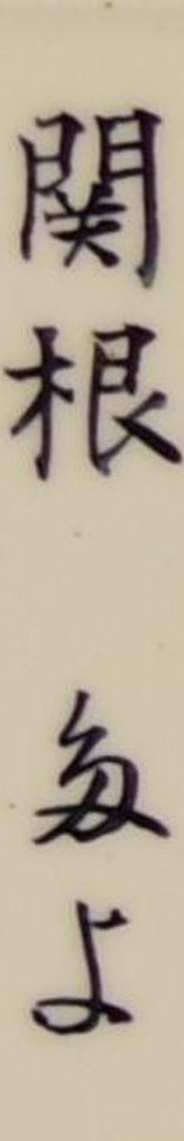関根たよ
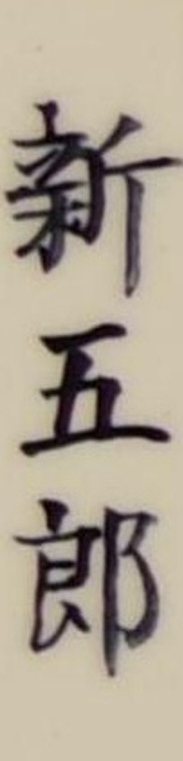新五郎
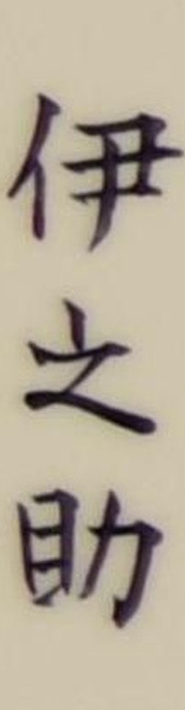伊之助
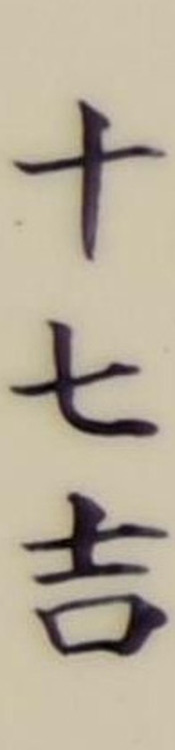十七吉

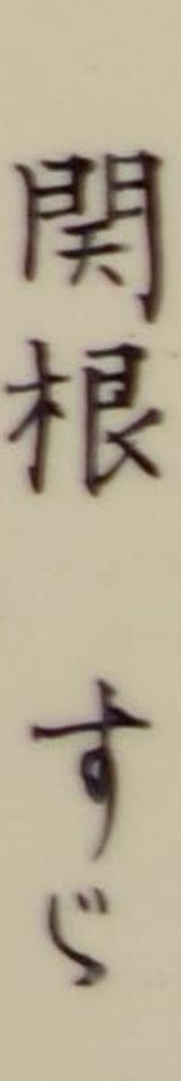関根すず
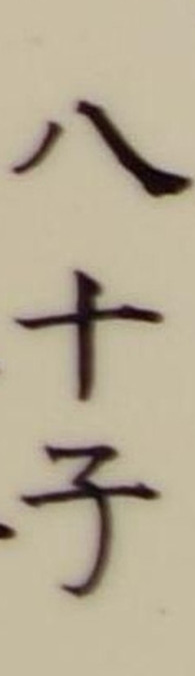八十子
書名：A~D
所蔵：koyasan kongobuji
